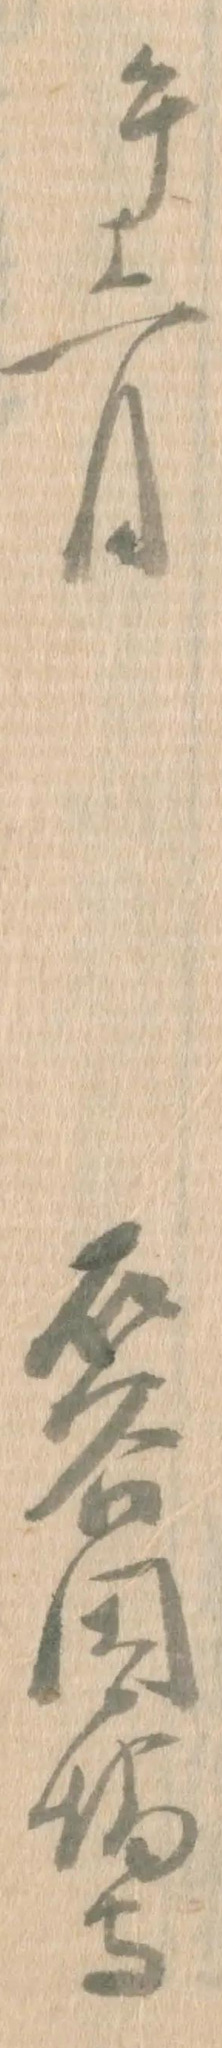午十二月石谷因幡守

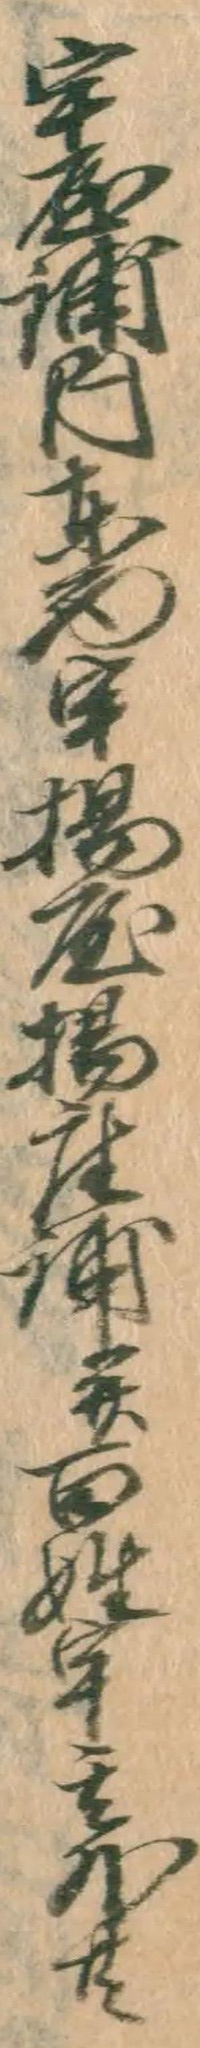│牢屋鋪内東西牢揚屋揚座鋪幷百姓牢其外共
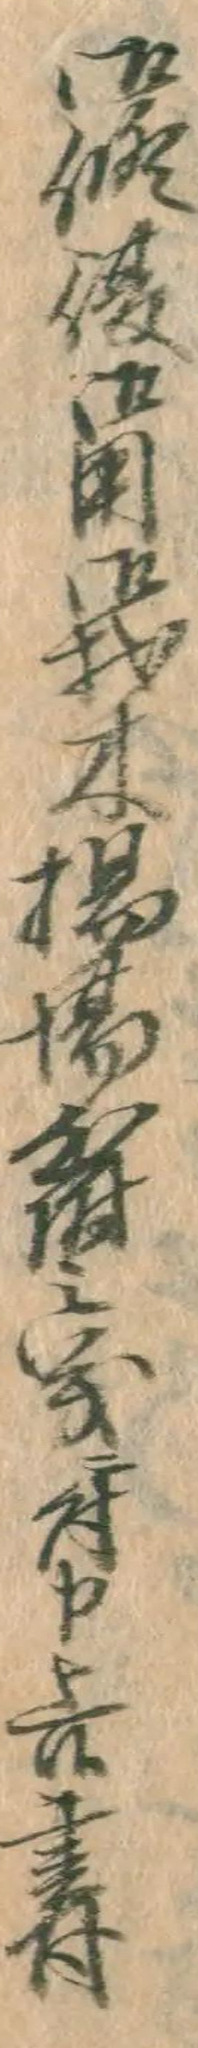│御修復御用御材木揚場心附之義ニ付申上候書付
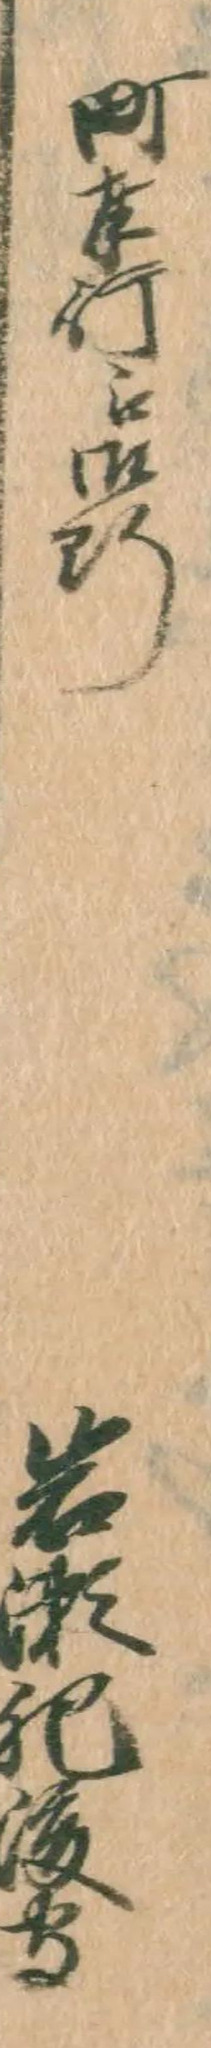│町奉行え御断岩瀬肥後守
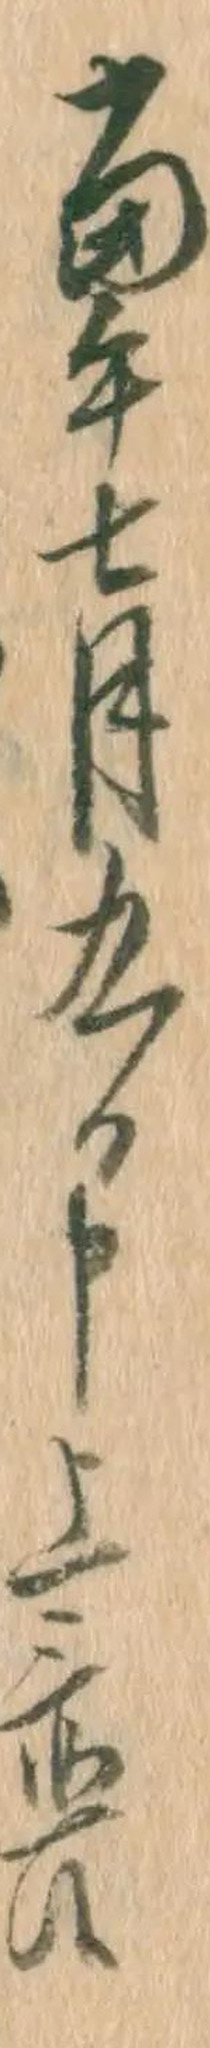当午七月九日申上置候
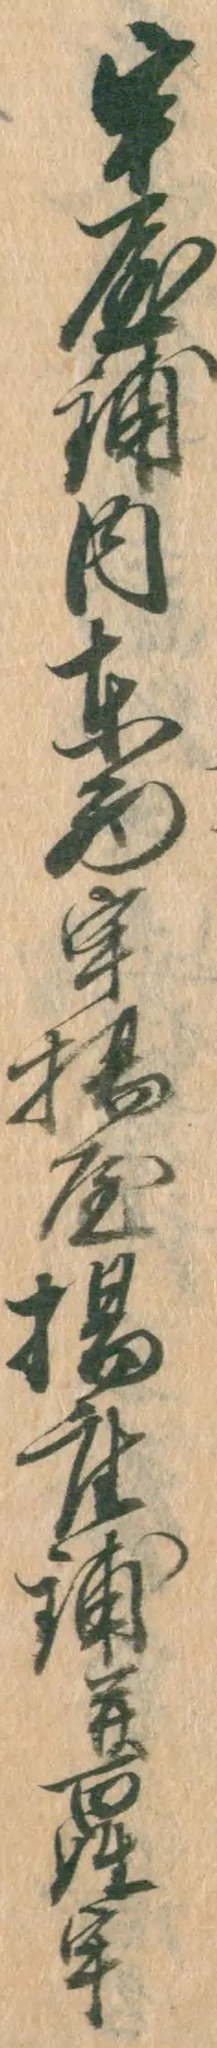牢屋鋪内東西牢揚屋揚座鋪幷百姓牢
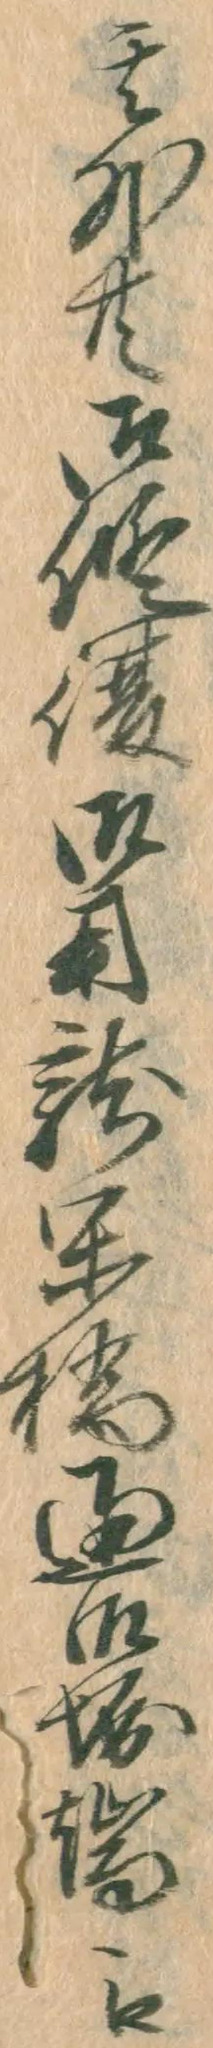其外共御修復御用龍閑橋通御堀端え

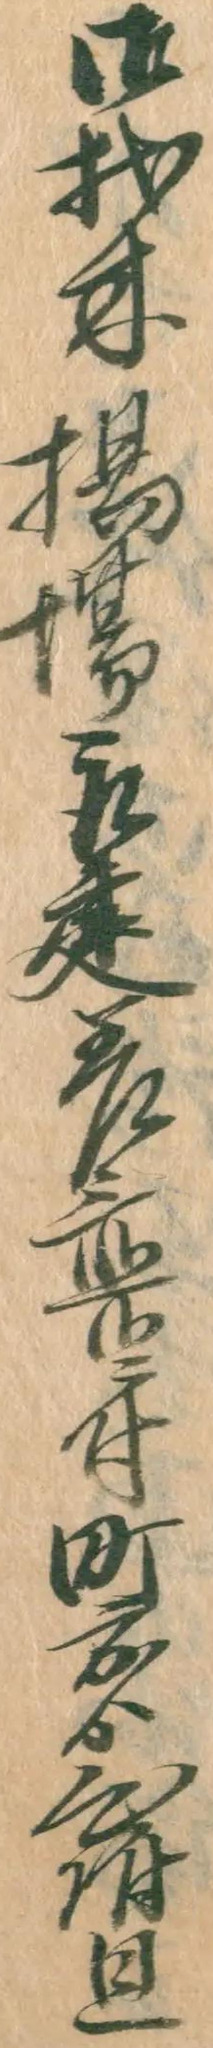御材木揚場取建差置候ニ付町方ゟ心附且
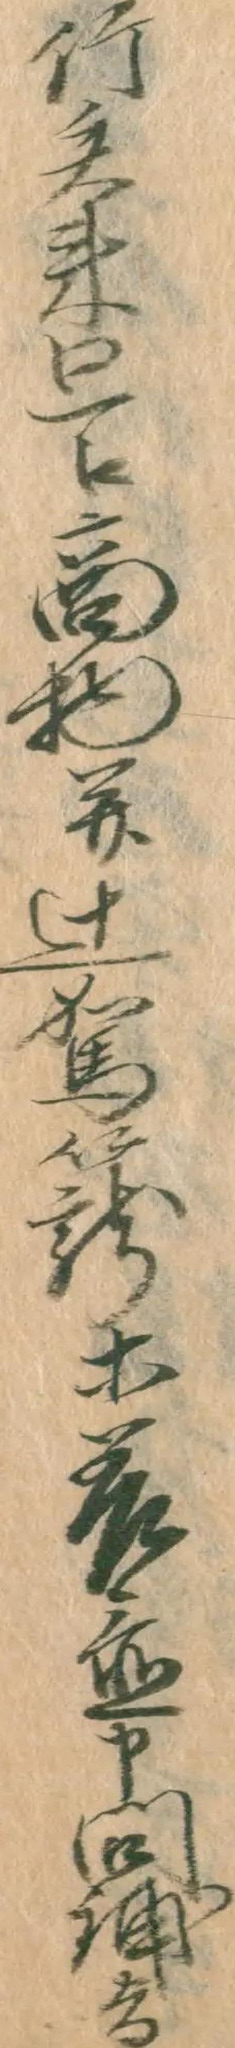竹矢来廻え商物幷辻駕籠等差置申間敷旨
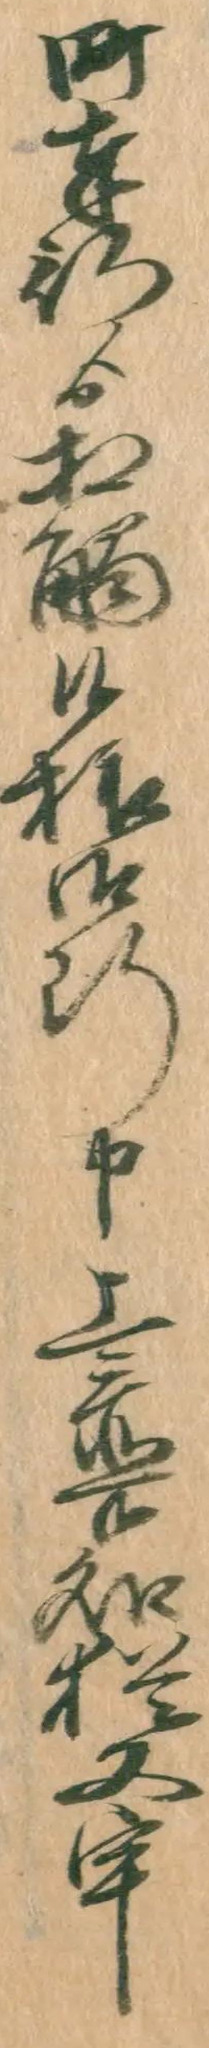町奉行ゟ相触候様御断申上置候処猶又牢
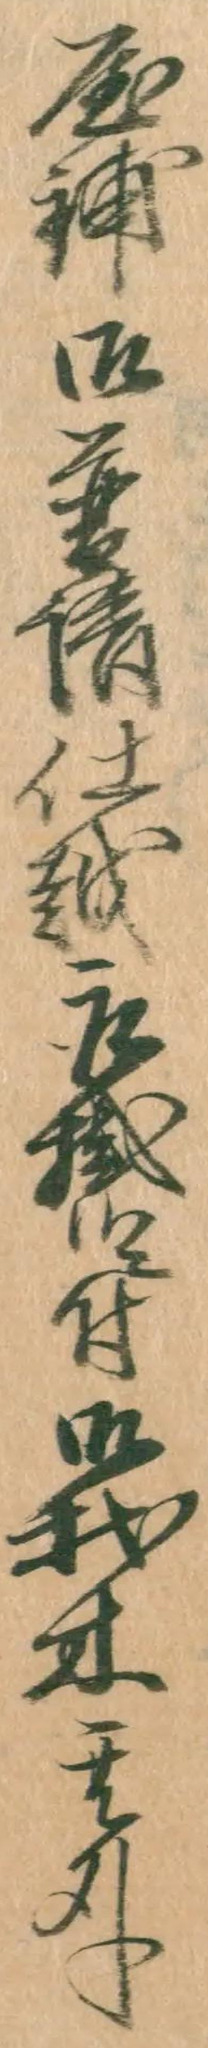屋鋪御普請仕越取掛候ニ付御材木其外
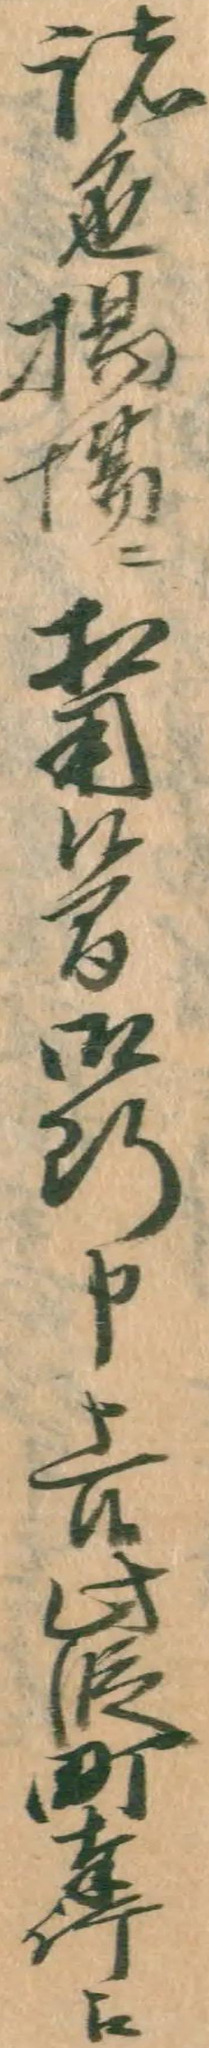諸色揚場ニ相用候間御断申上候此段町奉行え
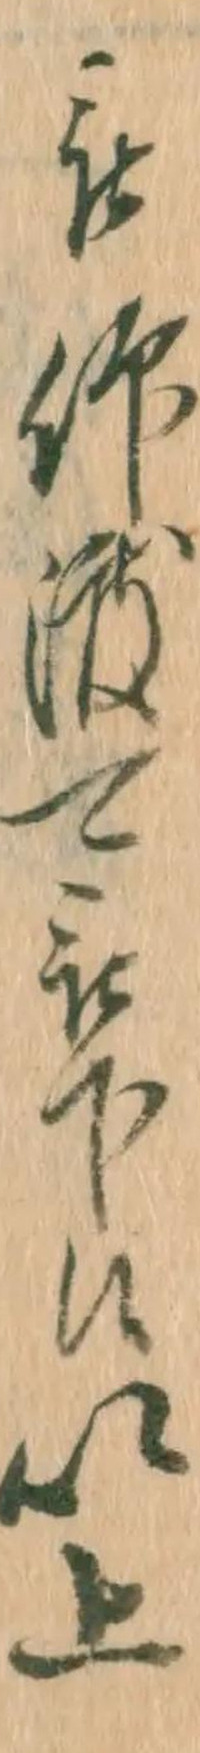被仰渡可被下候以上
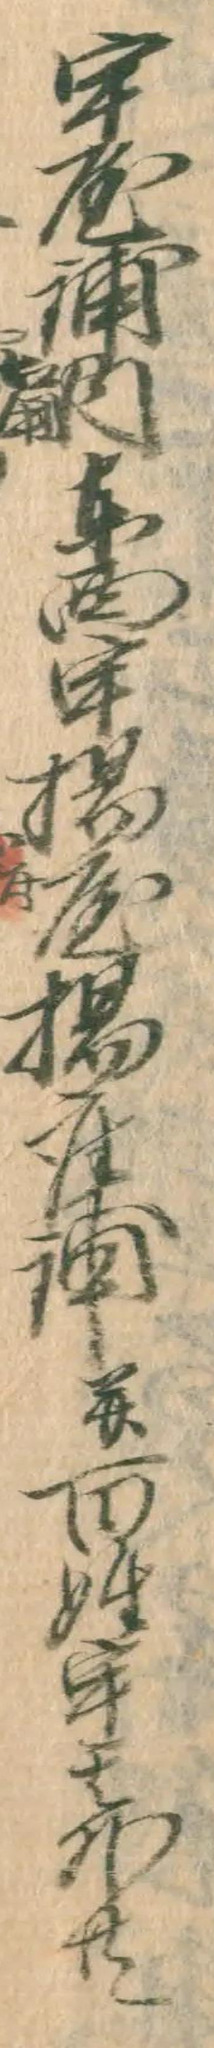│牢屋鋪内東西牢揚屋揚座鋪幷百姓牢其外共
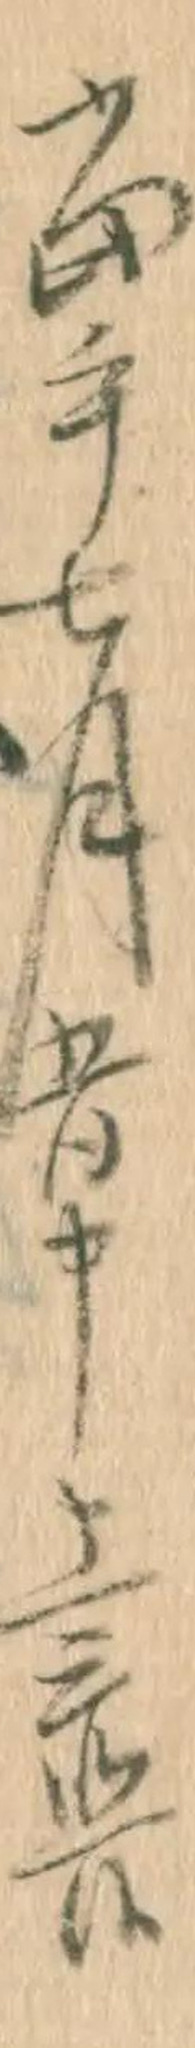当午七月九日申上置候
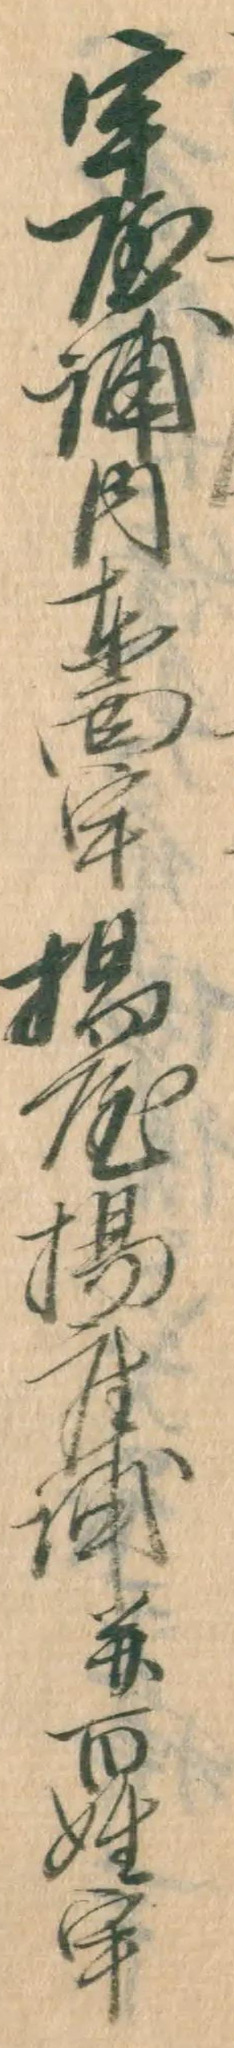牢屋鋪内東西牢揚屋揚座鋪幷百姓牢
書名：七十冊物類集 71巻. [44] 四十三 牢屋敷御普請御修覆地震ニ付骨折候牢屋掛御褒美之部
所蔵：国立国会図書館 National Diet Library, JAPAN
